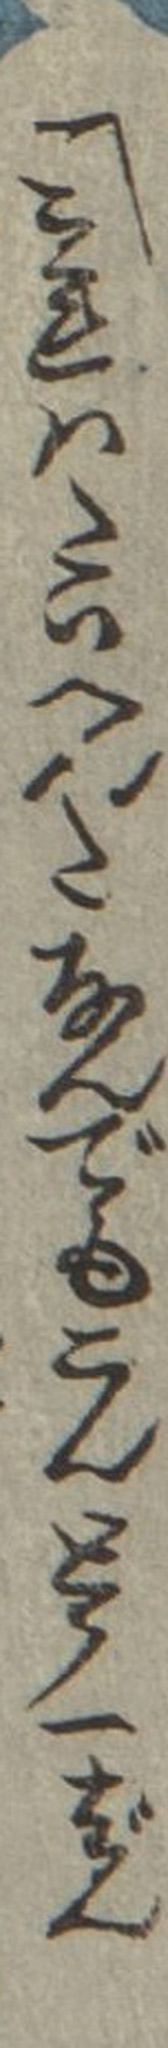「これはたいへんたなんでもこんとの一ばん
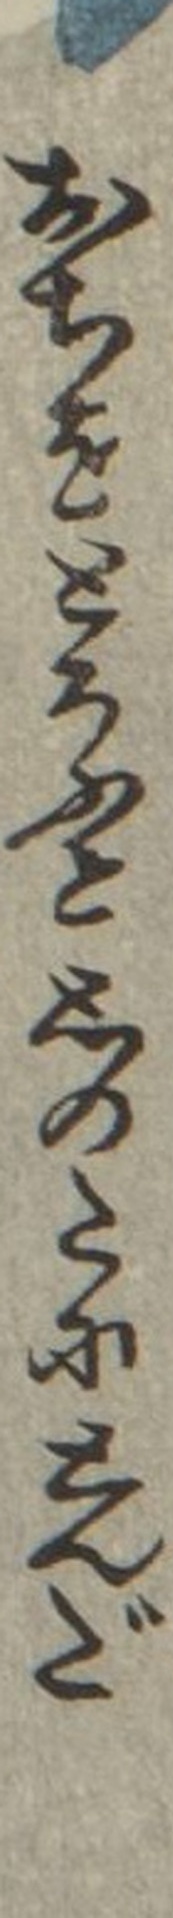おちをとろふと思つたにとんだ
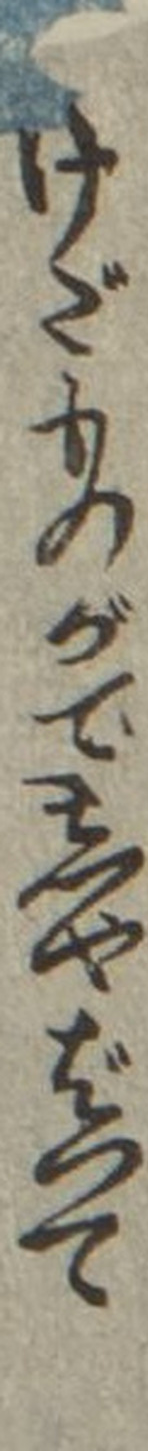けだものがてしやばつて
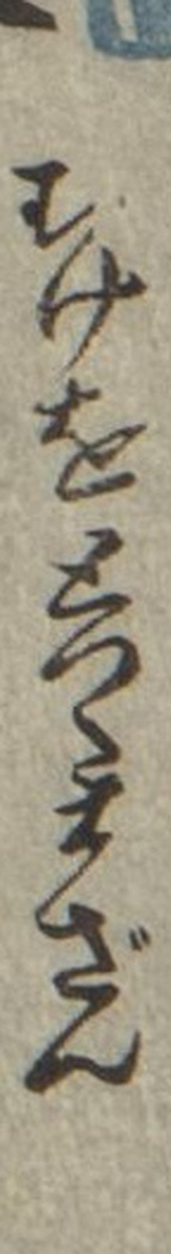ひけをとつたはざん
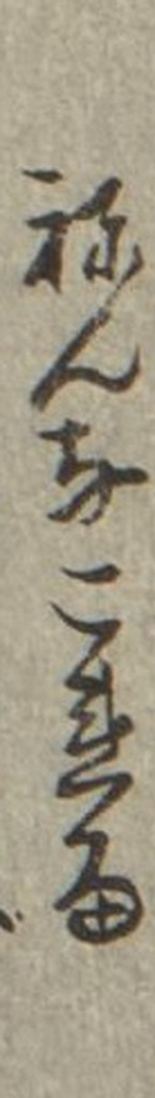ねんなこれた
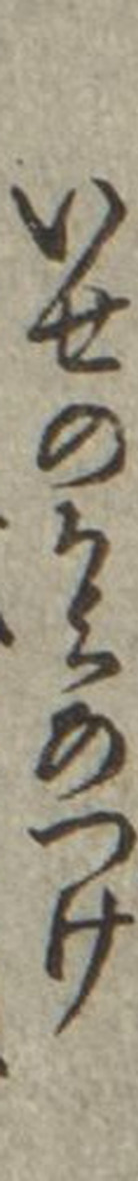いせのかみのつげ
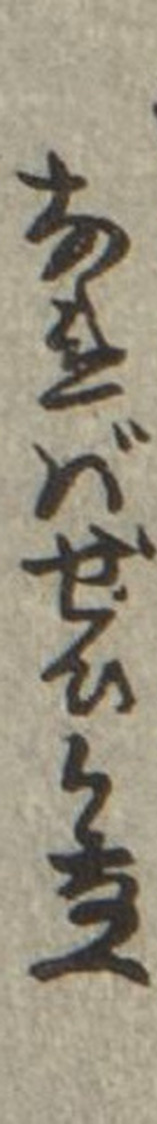なればぜひかなへ
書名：神馬と鯰
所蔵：あいおいニッセイ同和損保株式会社
